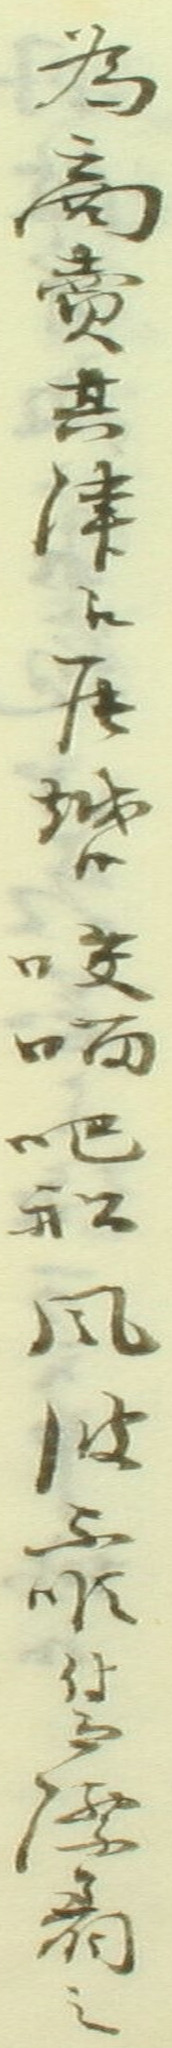為商売其津え罷越候咬𠺕吧船風波不順付而漂着之
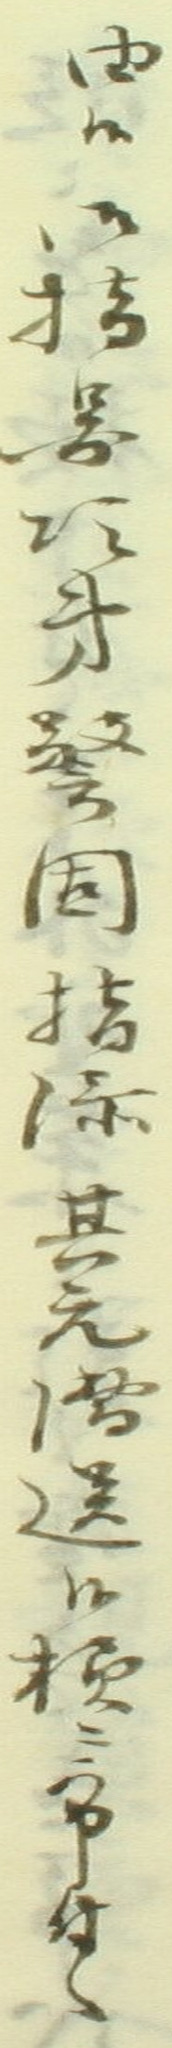由候御指図次第警固指添其元漕送候様に可申付候
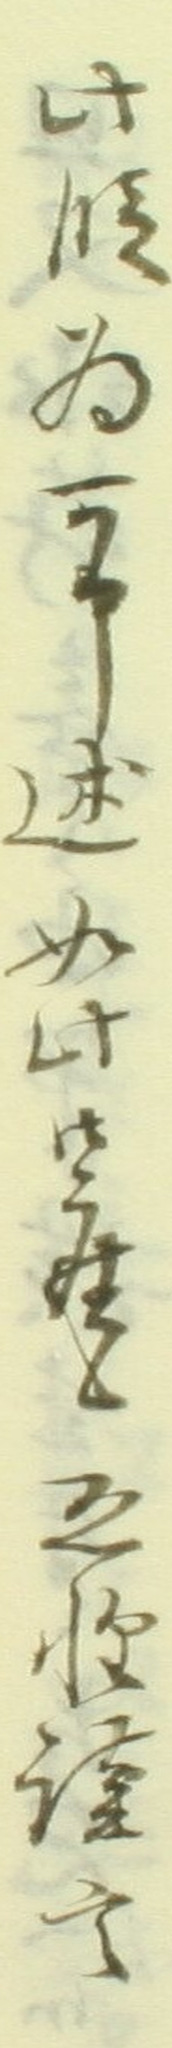此段為可申述如此御座候恐惶謹言
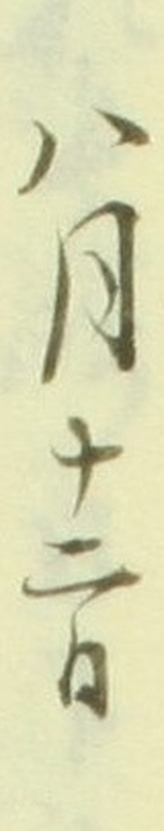八月十二日
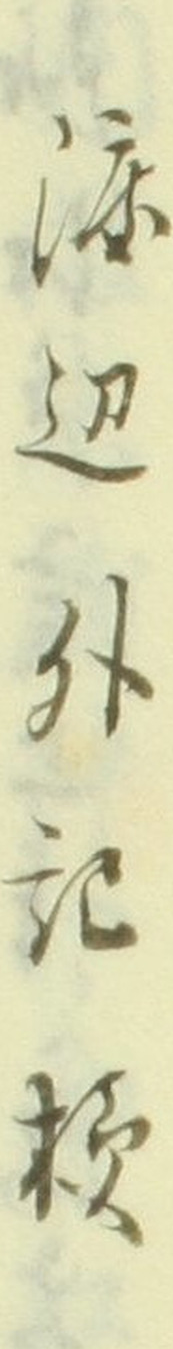渡辺外記様
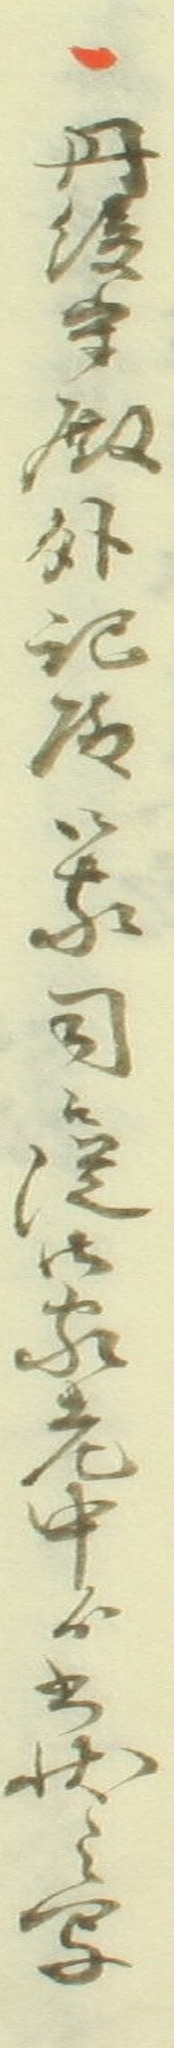丹後守殿外記殿御家司え従御家老中ゟ書状之写
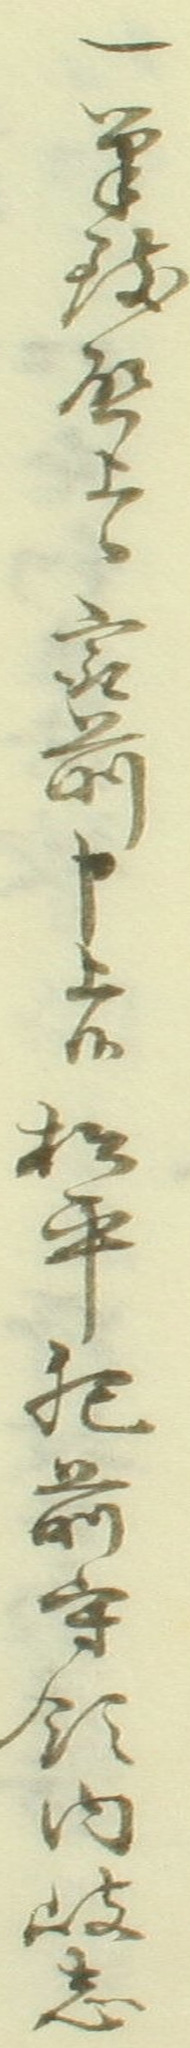一筆致啓上候最前申上候松平肥前守領内岐志
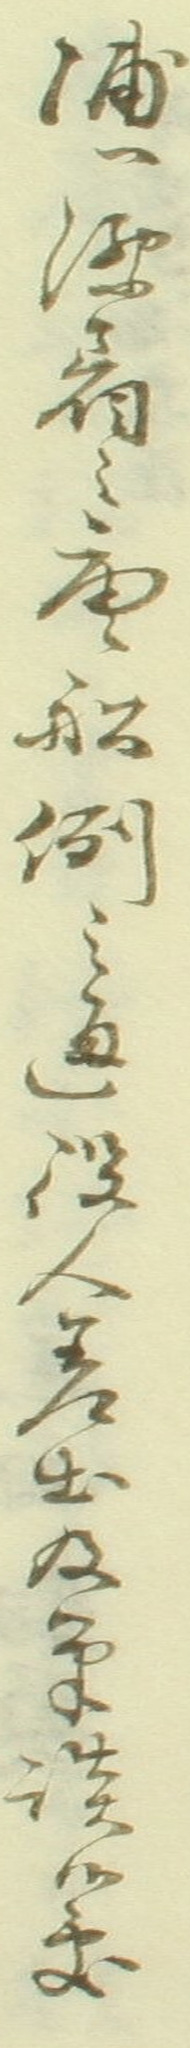浦へ漂着之唐船例之通役人差出及筆談候処
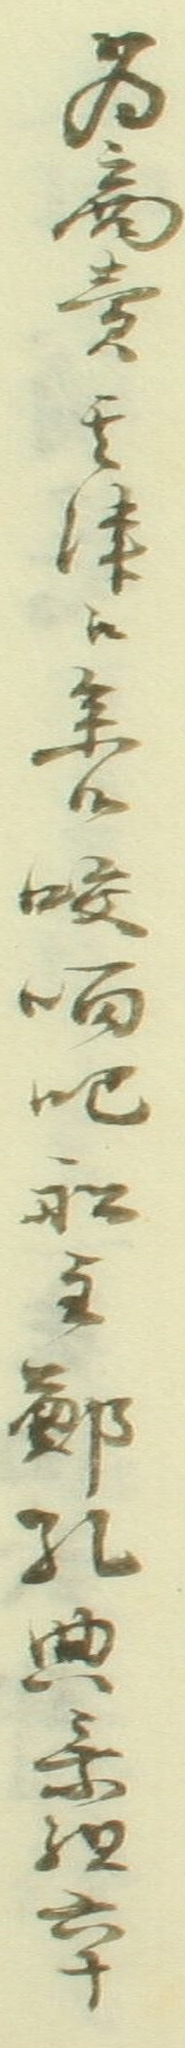為商売其津え参候咬𠺕吧船主禎孔典乗組六十
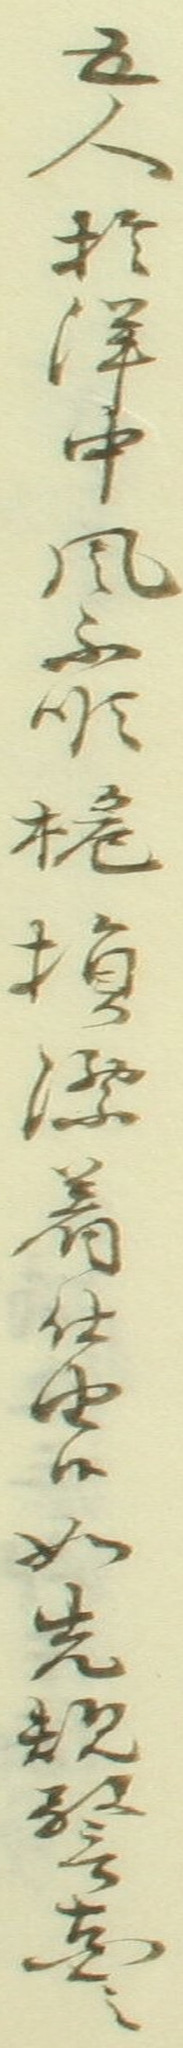五人於洋中風不順桅損漂着仕由候如先規警固之
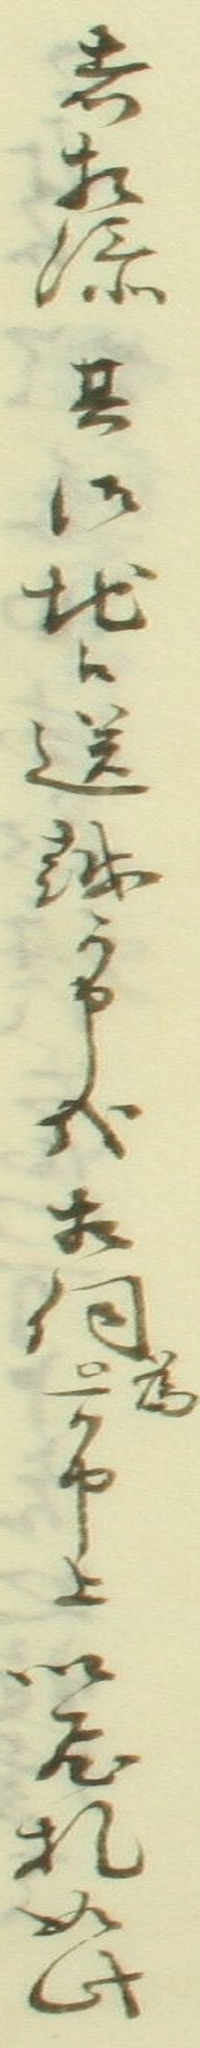者相添其御地え送越可申哉相伺◦可申上御飛札如此

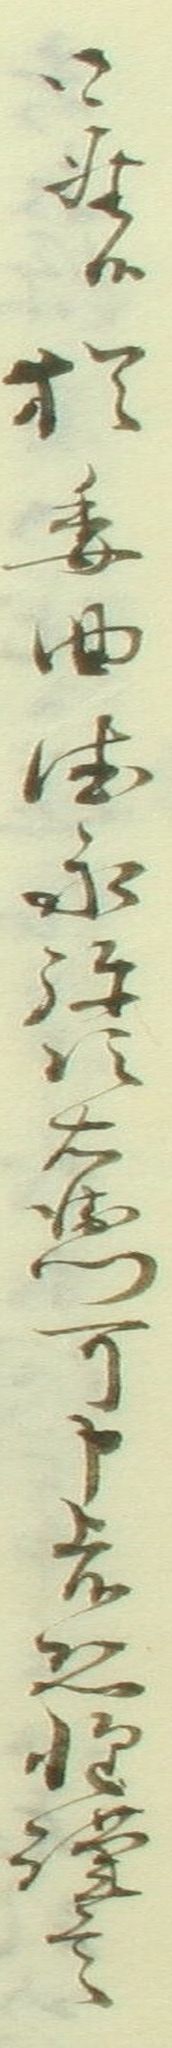御座候猶委曲徳永弥次右衛門可申上候恐惶謹言
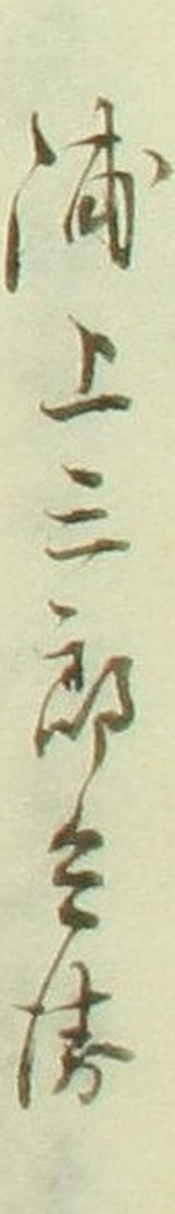浦上三郎兵衛
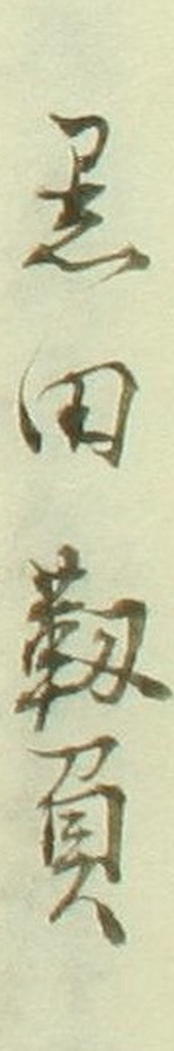黒田靭負
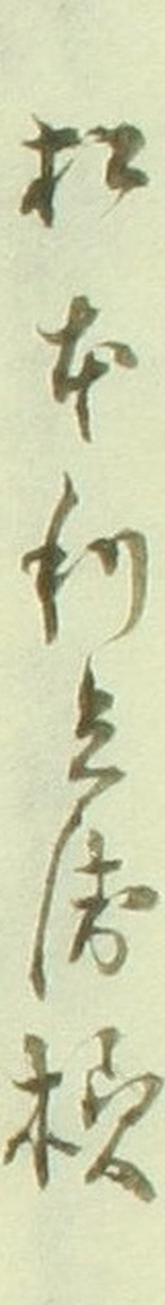松本利兵衛様
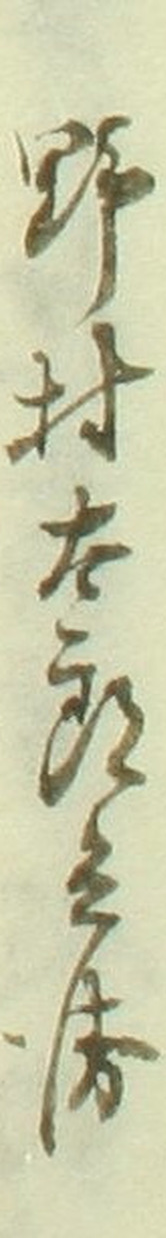野村太郎兵衛様
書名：異国船漂着記
